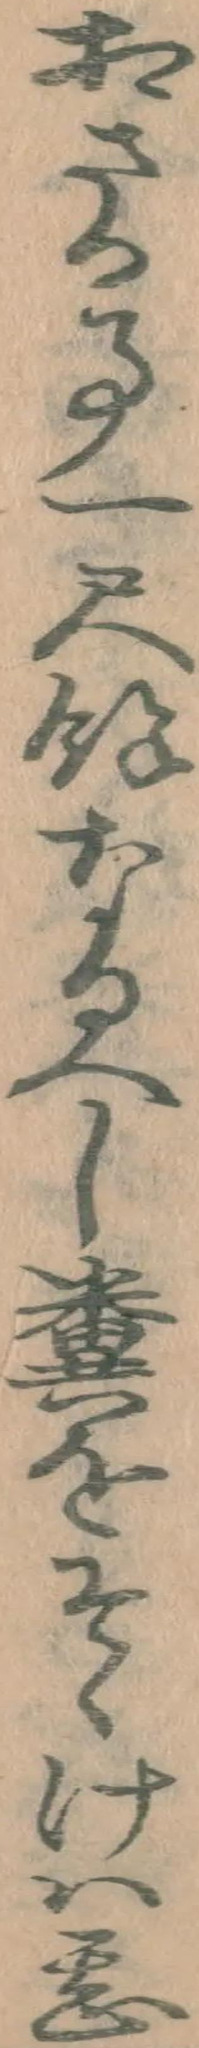相さる事一尺余なるへし糞をそゝけは甚
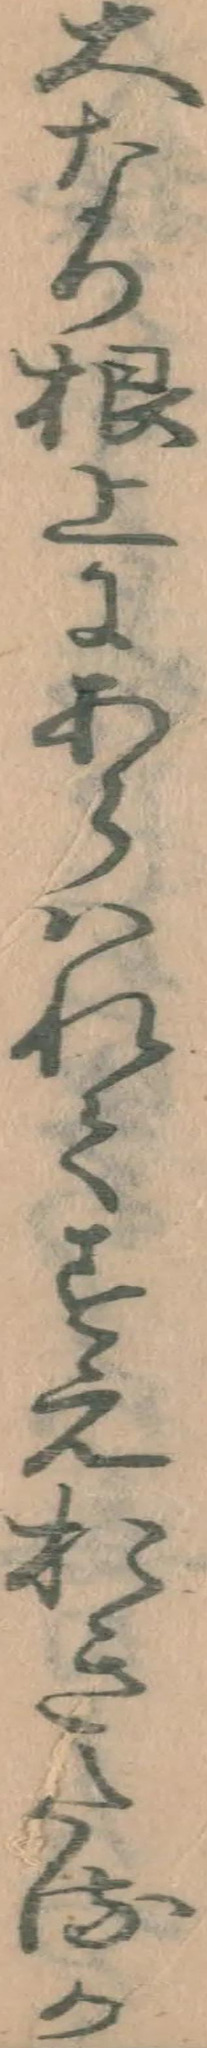大なり根上にあらはれてすえおきたるか
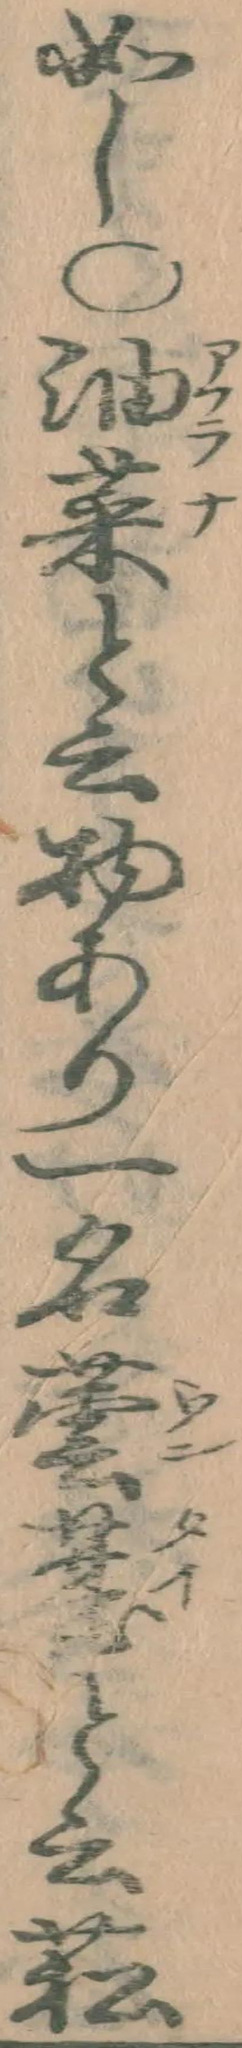如し〇油菜と云物あり一名蕓薹と云菘
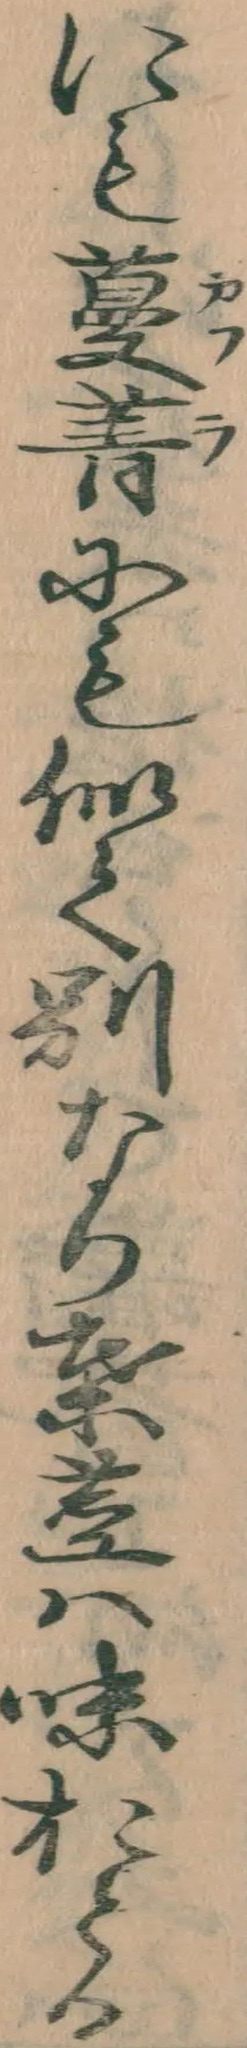にも蔓菁にも似て別なり葉茎は味おとる
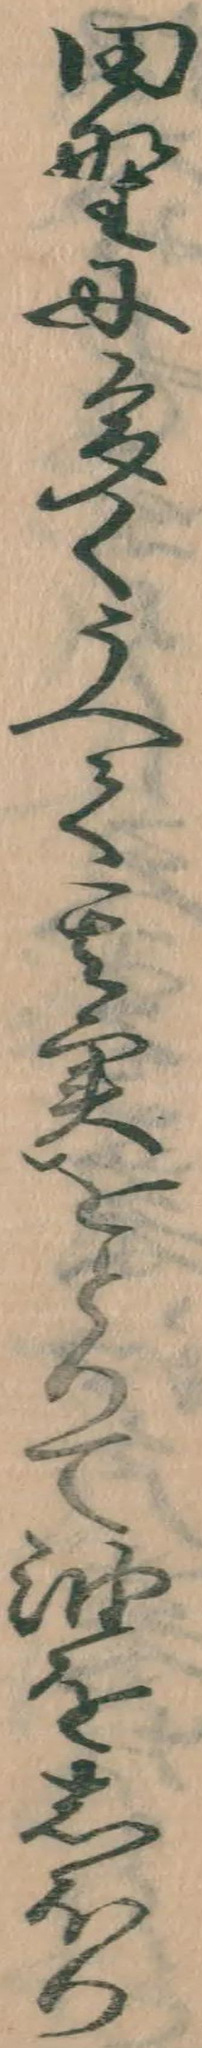田野に多くうへて其実をとりて油をしほり
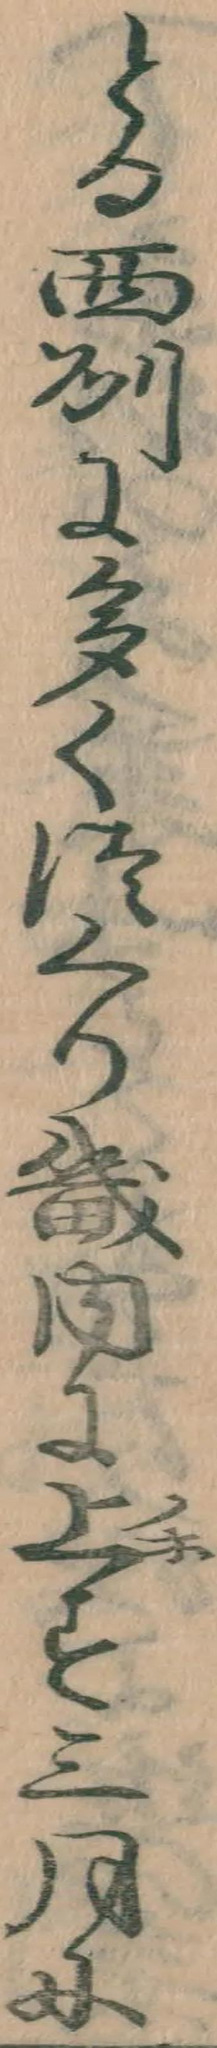とる西州に多くつくり畿内に上す三月に
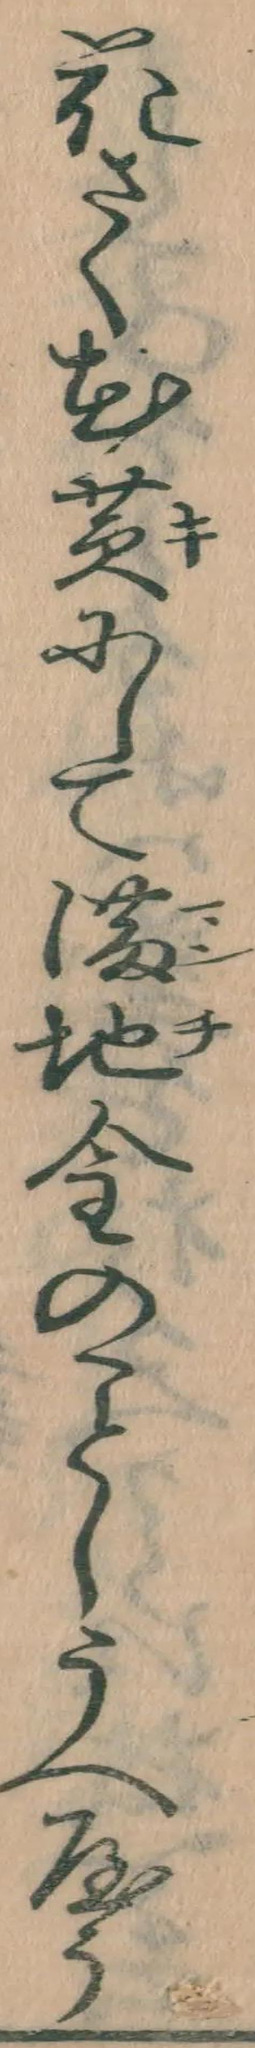花さく花黄にして満地金のことしうへやう
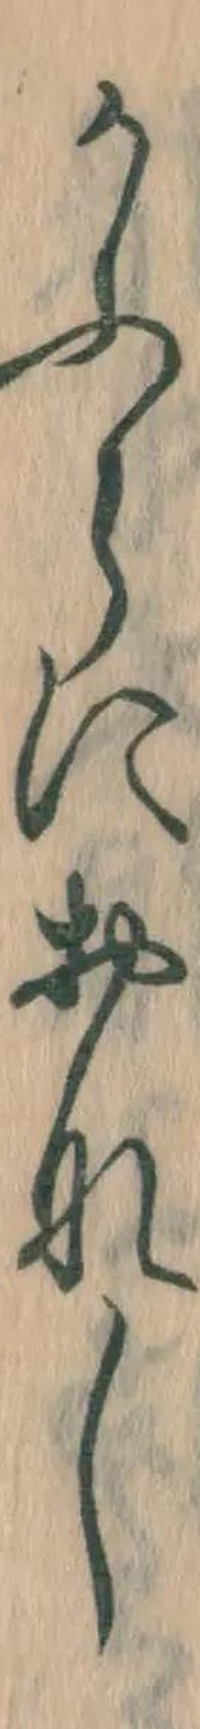かふらにおなし
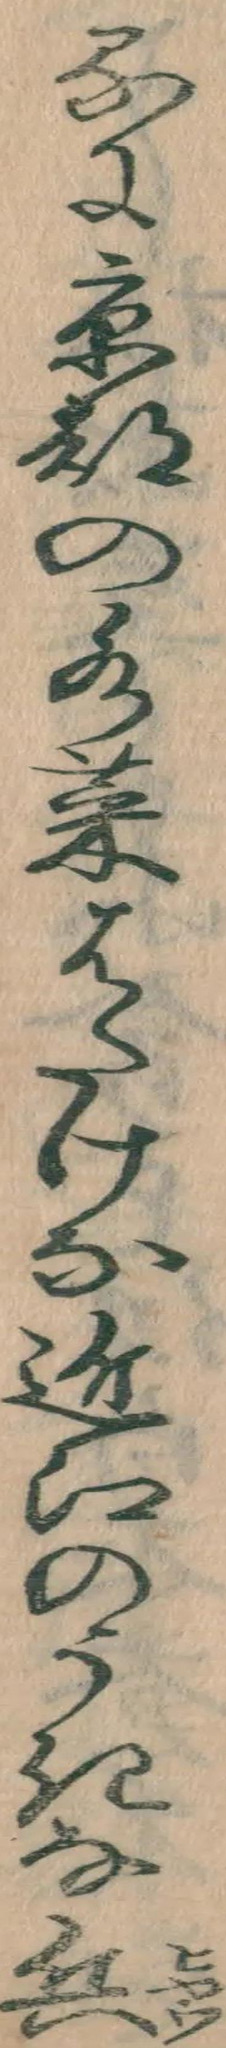るに京都の水菜はたけな近江のうきな兵
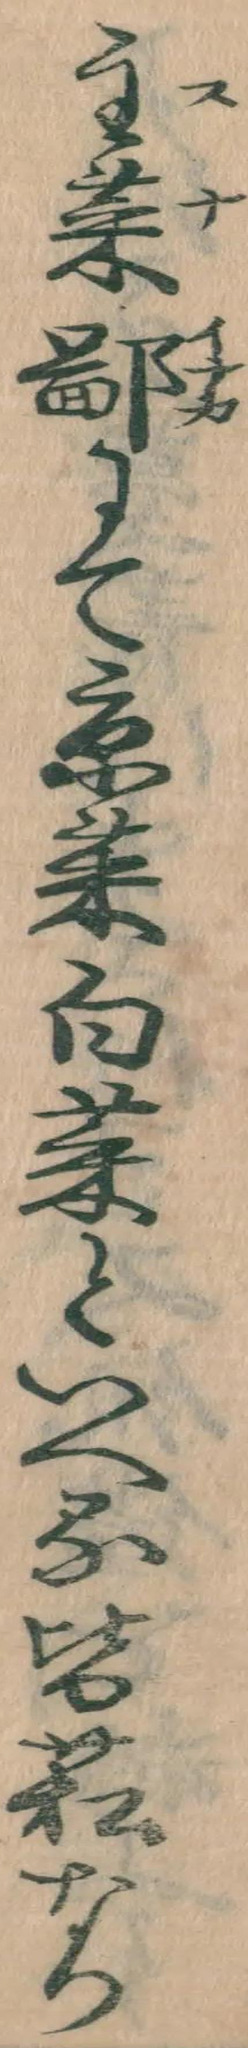主菜鄙にて京菜白菜といへる皆菘なり
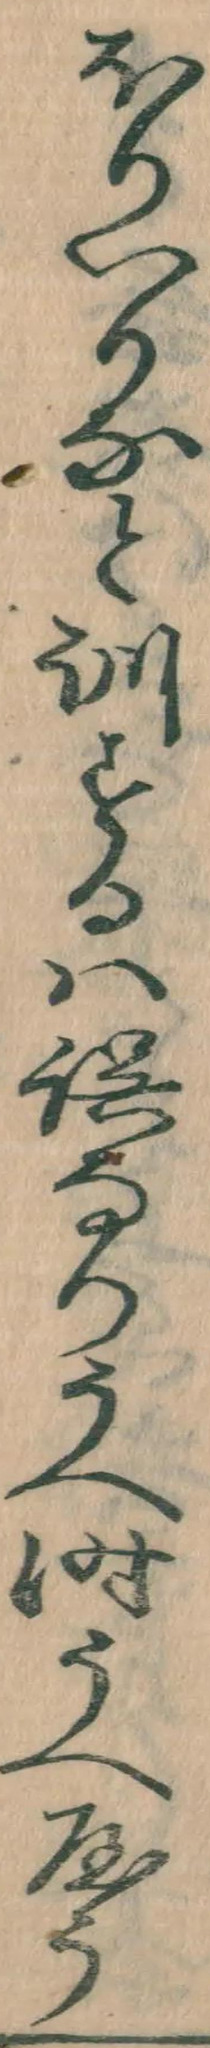ほりいりなと訓するは誤なりうへ時うへやう
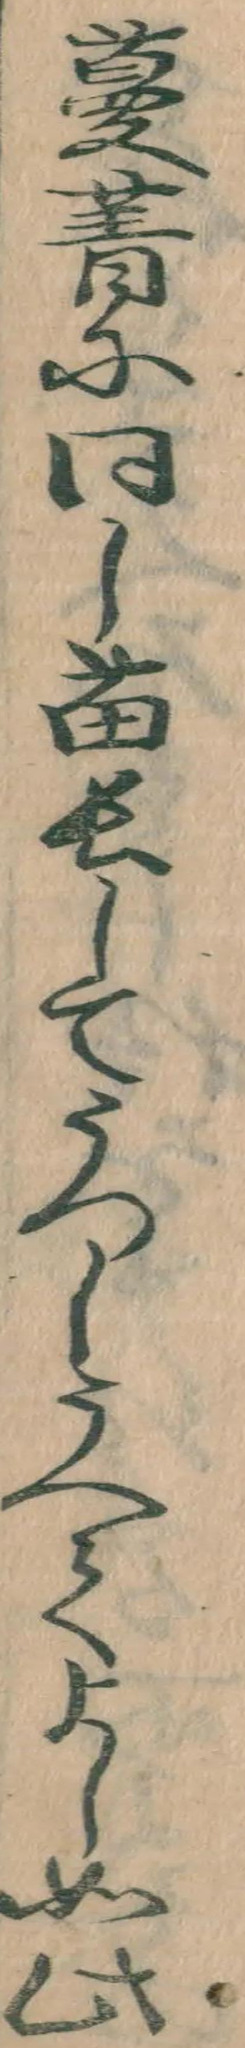蔓菁に同し苗長してうつしうへてよし如此

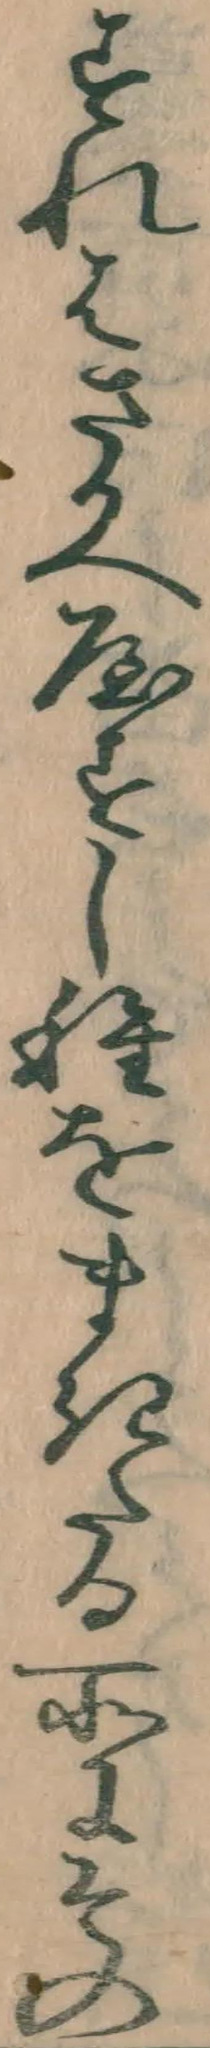すれはさかへやすし種をまきたる所にその
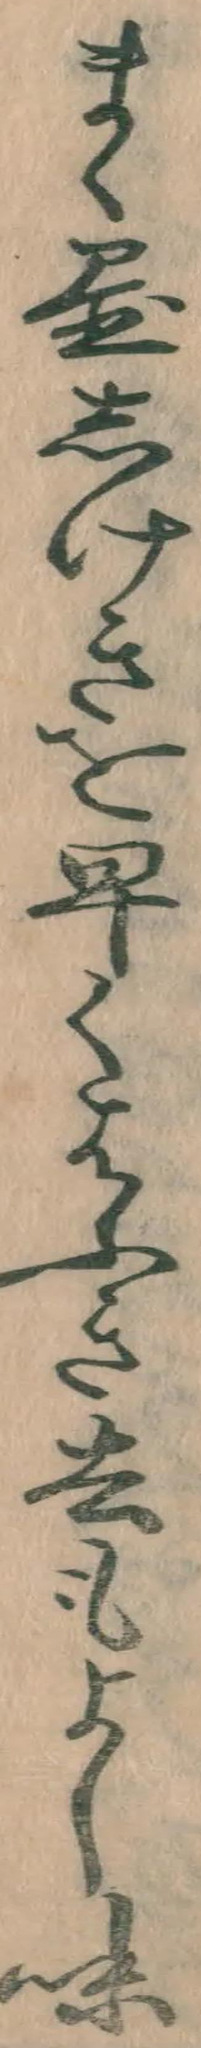まゝ置しけきを早くはふき去もよし味
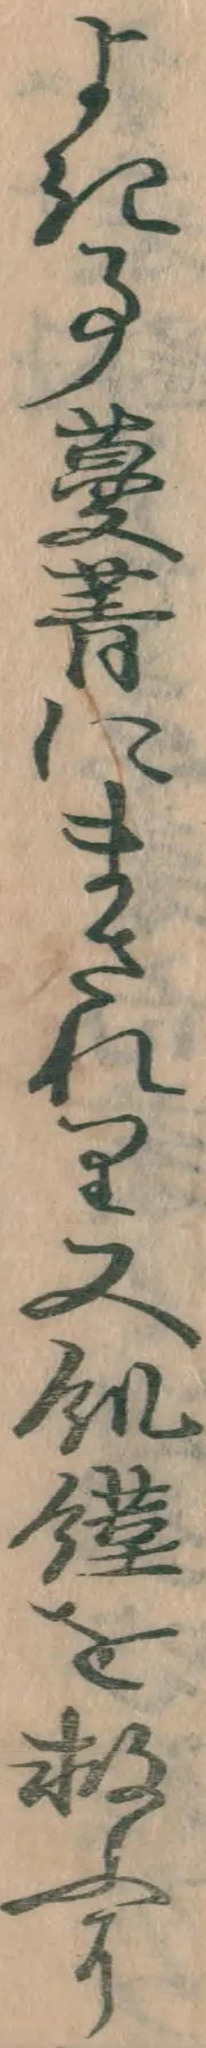よき事蔓菁にまされり又飢饉を救ふに
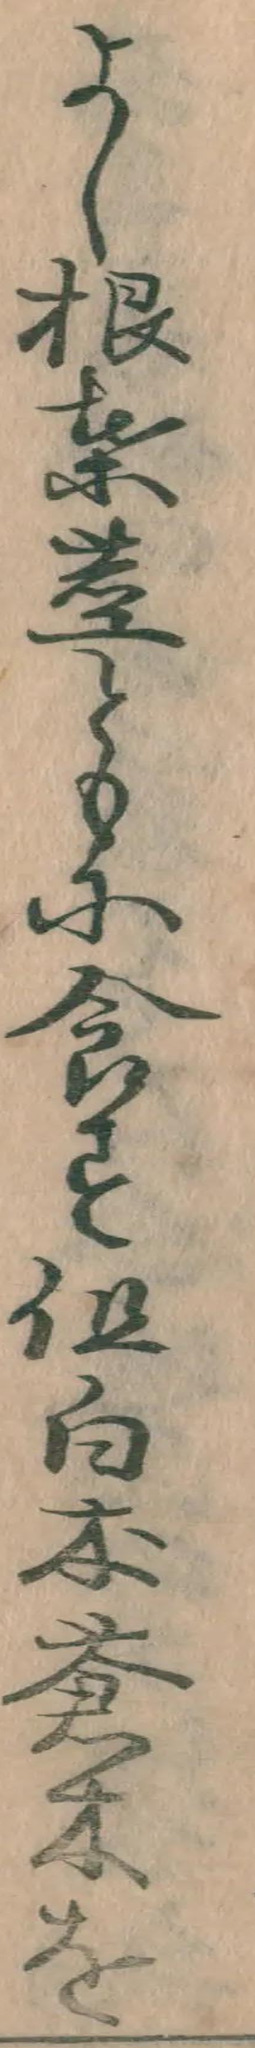よし根葉茎ともに食す但白朮蒼朮を
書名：菜譜 3巻
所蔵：国立国会図書館 National Diet Library, JAPAN
